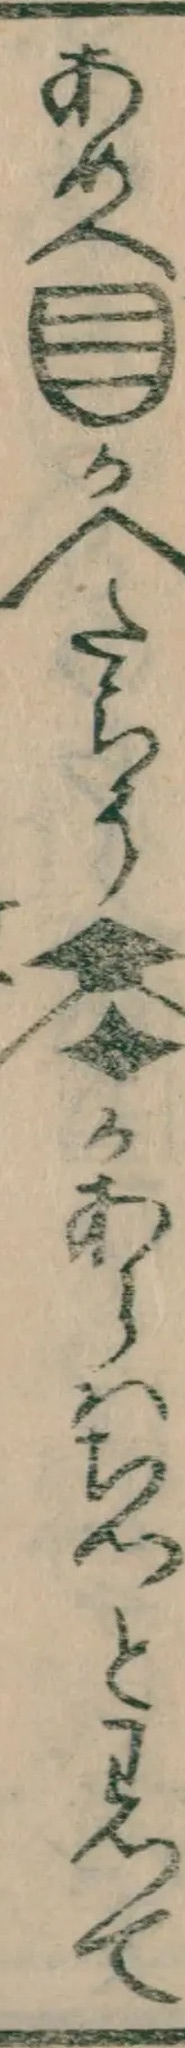あめへかたらうかあらはいつとわつて
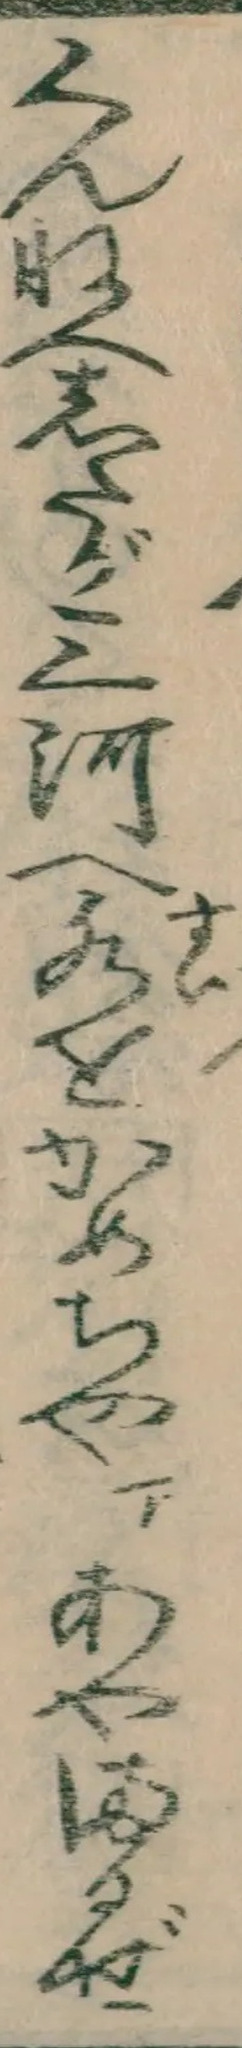くんなへしたが三河へ水をかめちやァあやまるぜ
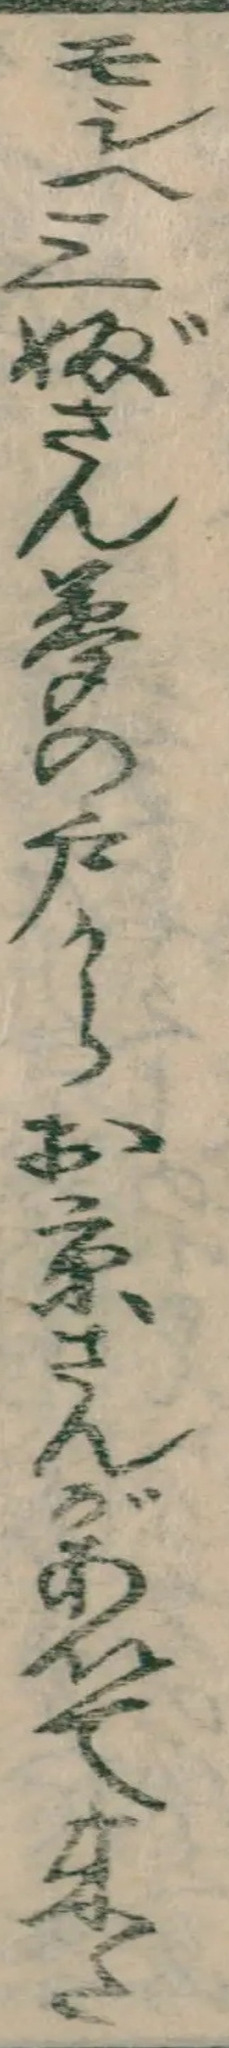モシへ三ぶさん夢の戸からお京さんがあいて来た
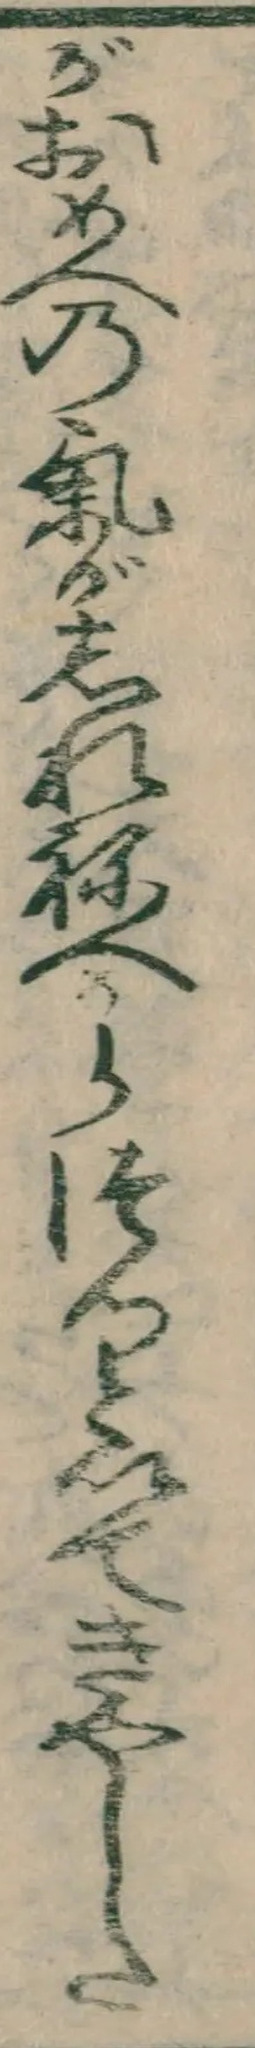がおめへの気がしれねへからつつといてきやした
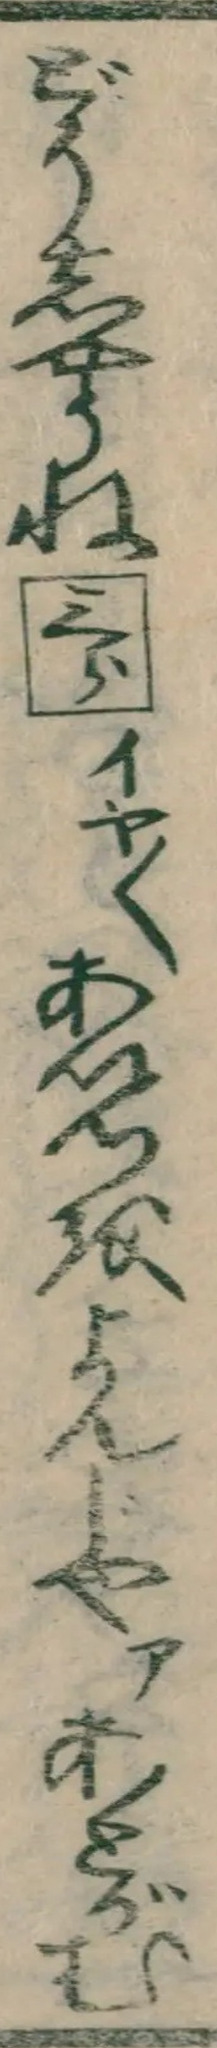どうしやうね〈三郎〉イヤ〳〵あいつをよんじやァあとがむ

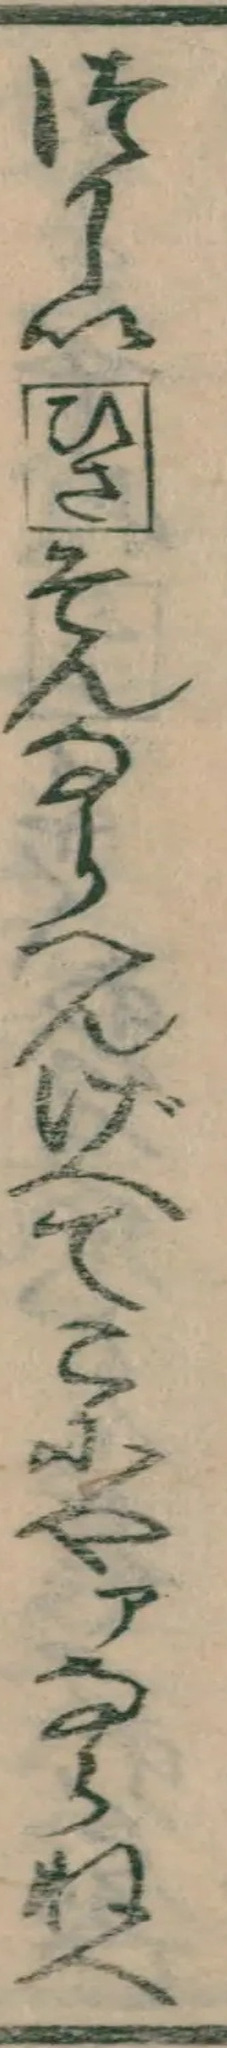つかしい〈ひさ〉そんならへんげへてこにやァならねへ
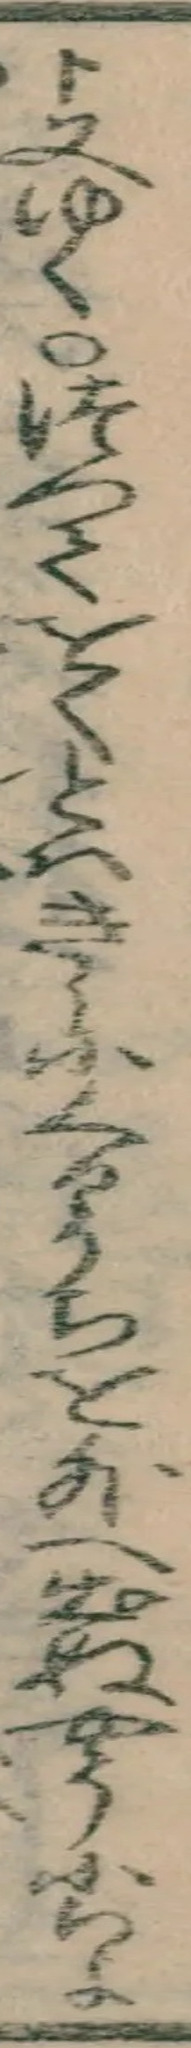ト又ゆく○つつてをくとはきゝにくるうちを外へ出ぬやうにちよ
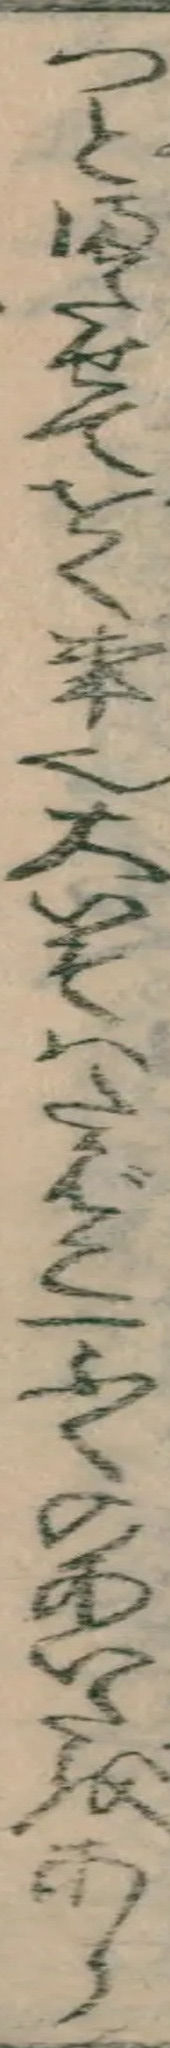つとまたせてをく事也大いそはたばこ一ふくのあいたをあら
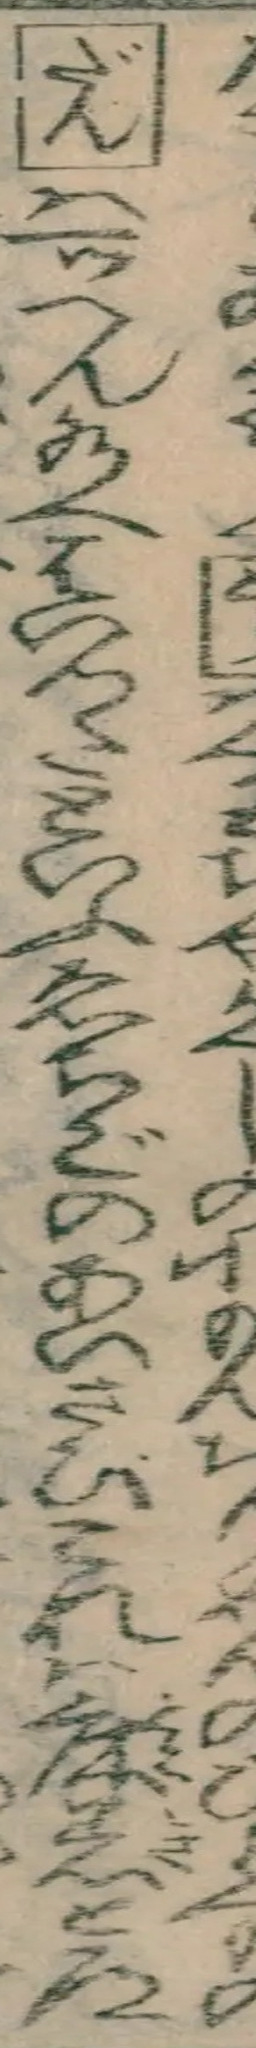〈だん〉は一ツへん水へはいつたといふゑちごのあいさびこれは床着と道
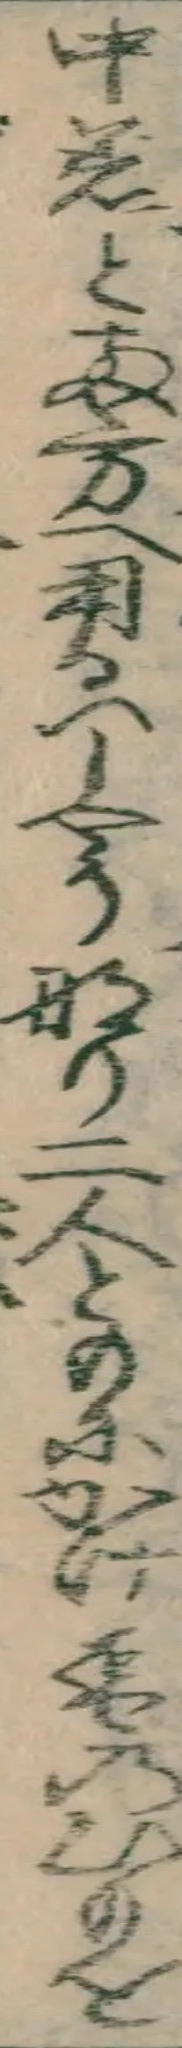中着と両方へ用るいしやうなり二人ともにかけ香のひもを
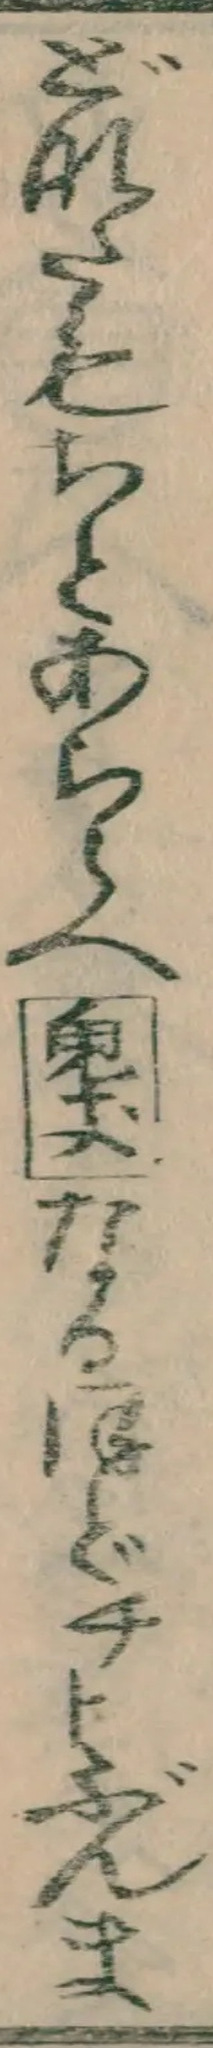どなたもちとあちらへ〈鬼丈〉なるほどチトぶんま
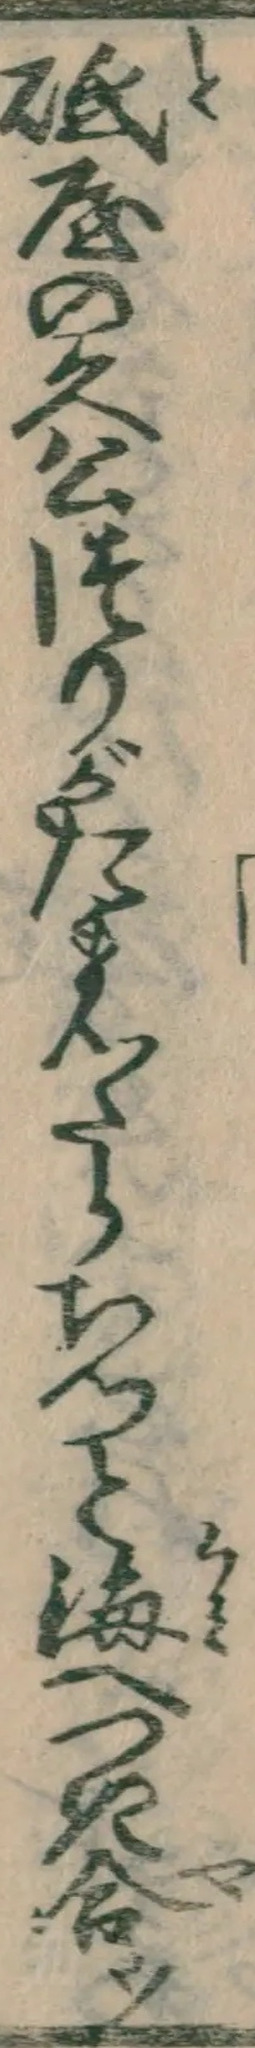砥屋の久公つりがたまつたらちつと海へつき合ゥ
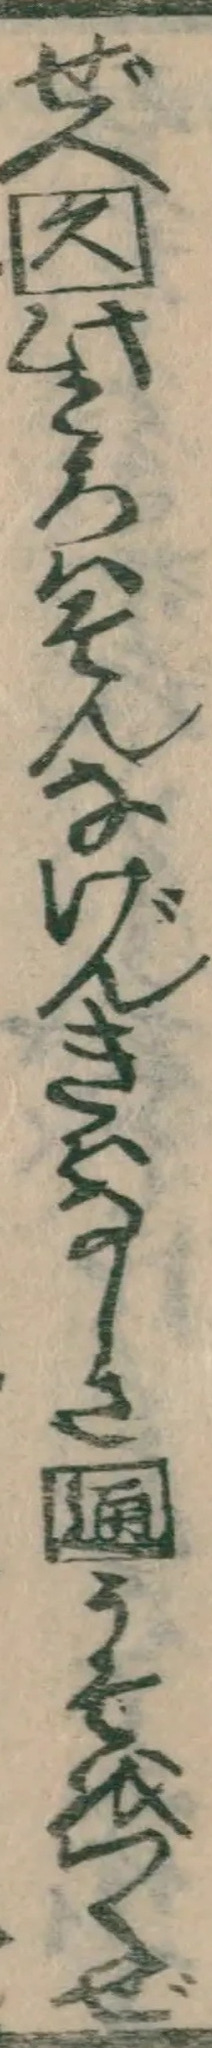ぜへ〈久〉此ころはそんなげんきはなしさ〈通〉うそをつくぜ
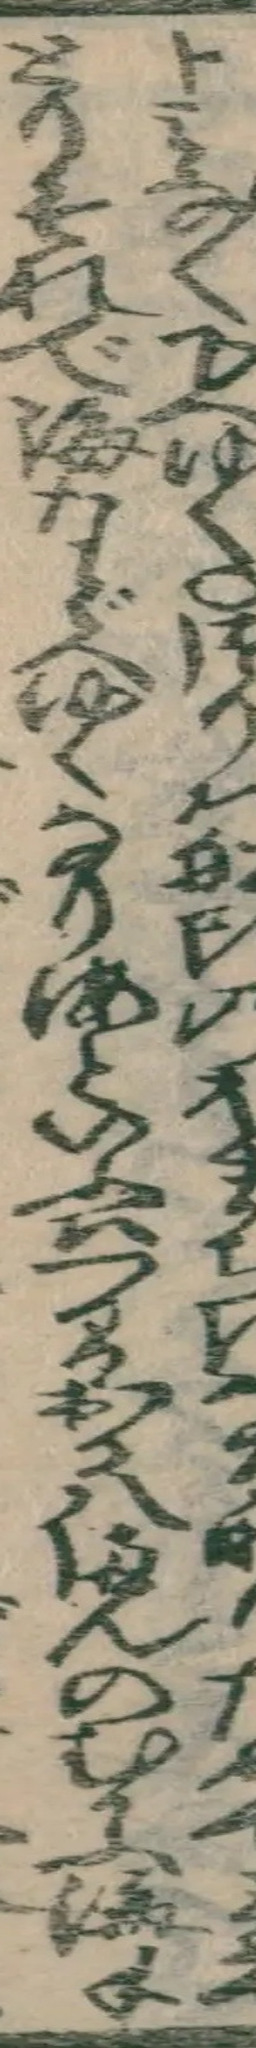とりそれで海などへゆくなり海といふはつるかおか八まんのむかふ海手
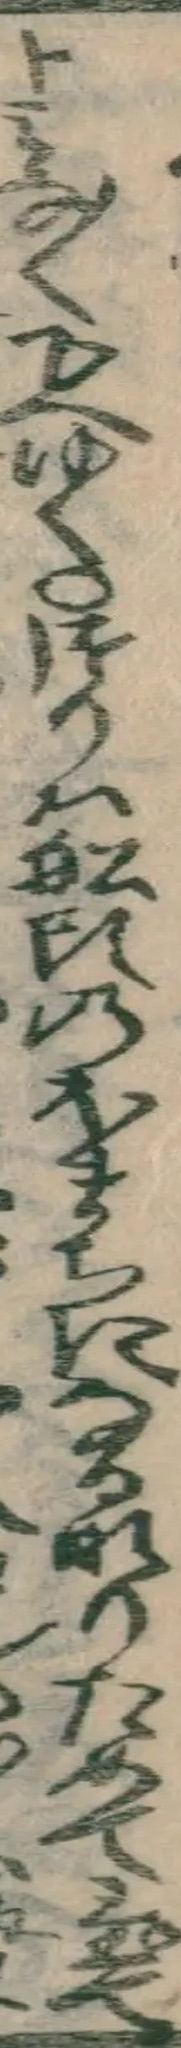トみな〳〵下へゆく○つりは船頭のほまちになるなりためて置て
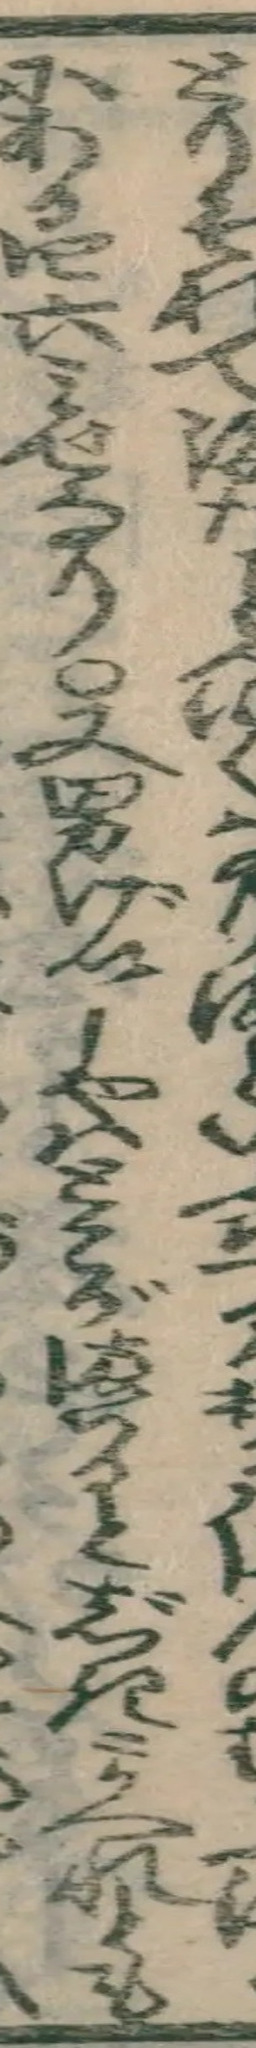にある四六みせなり○又男げいしやはとこがまはるとじきにかへれとも
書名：教訓読本：大礒風俗仕懸文庫
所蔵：国立国会図書館 National Diet Library, JAPAN
